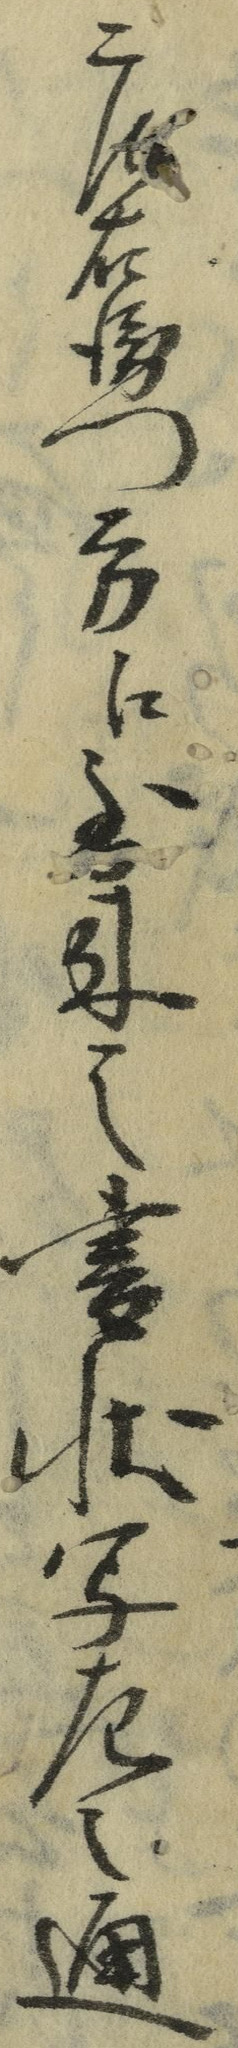庄右衛門方え至来之書状写左之通
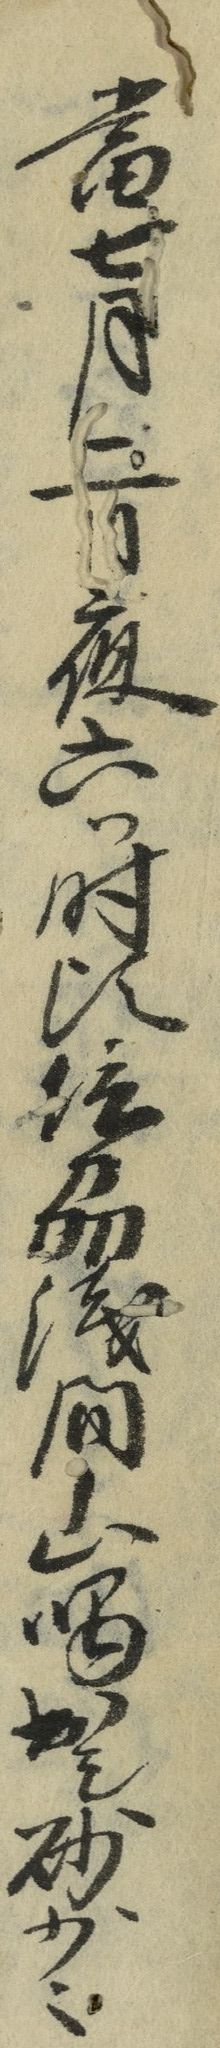一当七月二日夜六ツ時頃信州浅間山鳴出シ砂少々
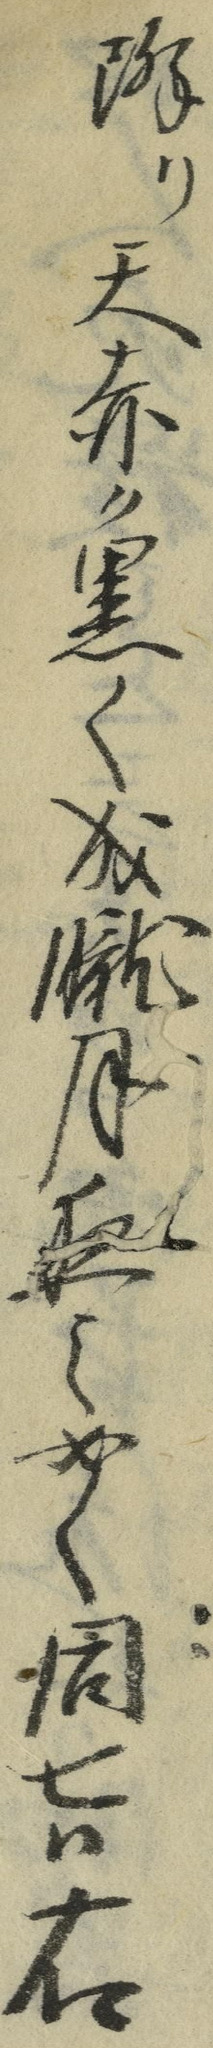降り天赤ク黒く成朧月夜之如く同七日右
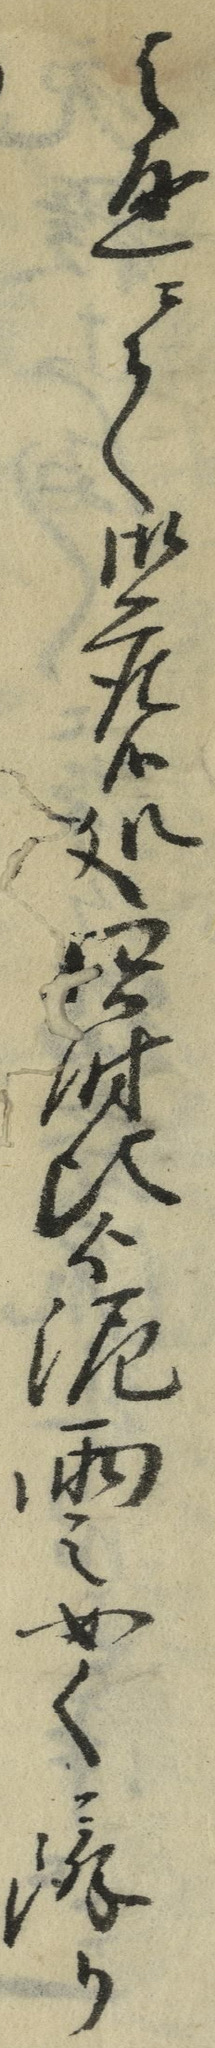之通にて御座候処四ツ時頃ゟ泥雨之如くに降り
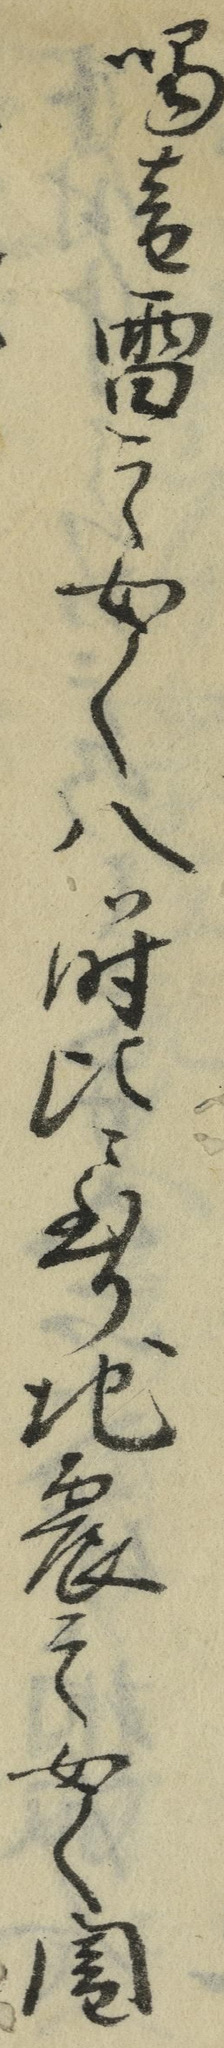鳴音雷之如く八ツ時頃に至り地震之如く闇
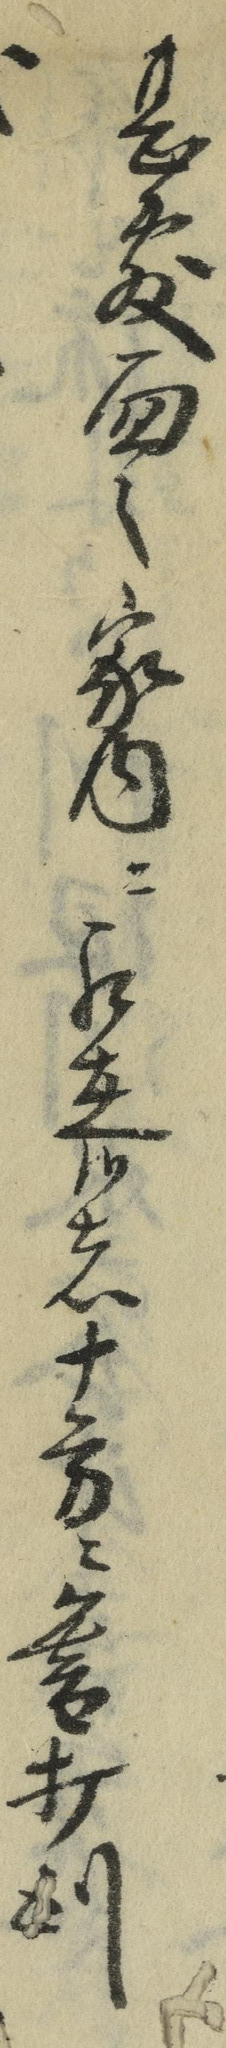甚敷面々家内に罷在候者十方に暮打刈
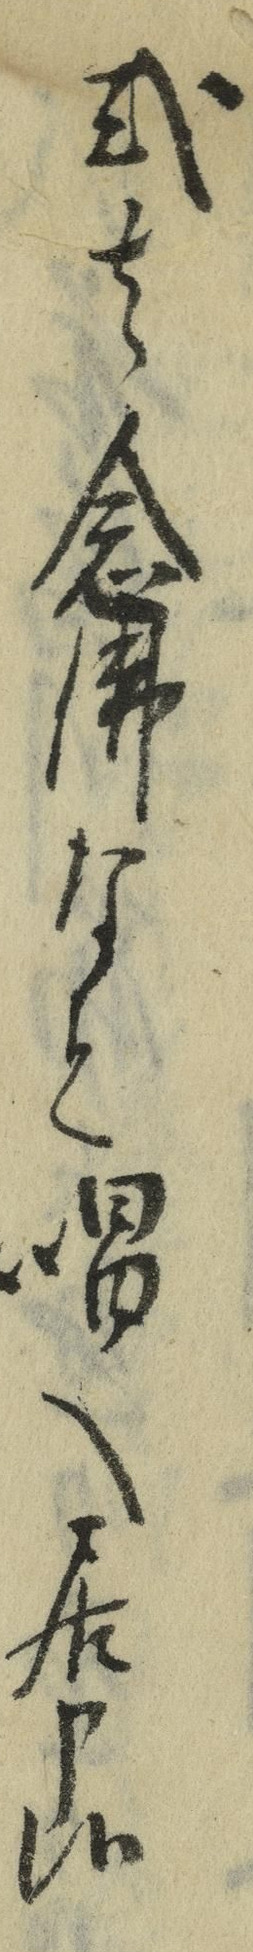或は念仏なと唱へ居申候
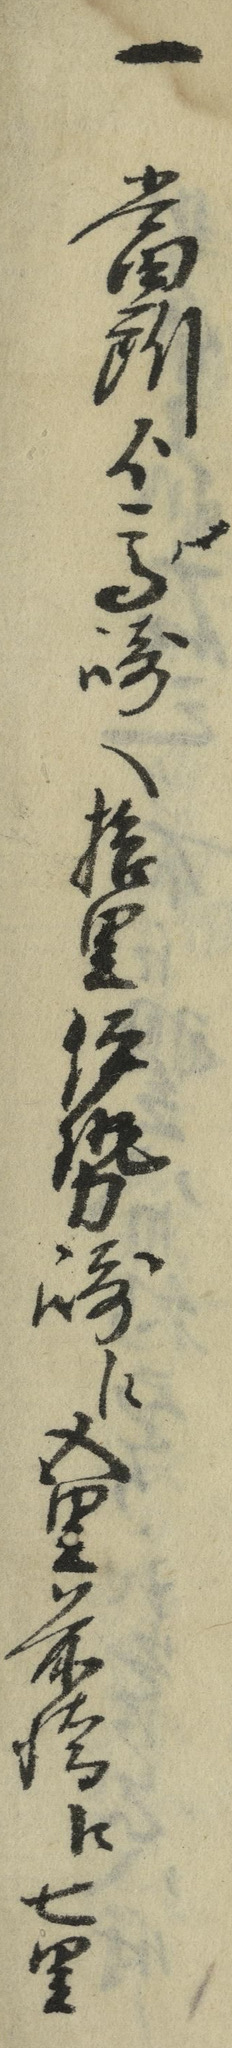一当所ゟ高崎へ拾里伊勢崎え五里前橋江七里

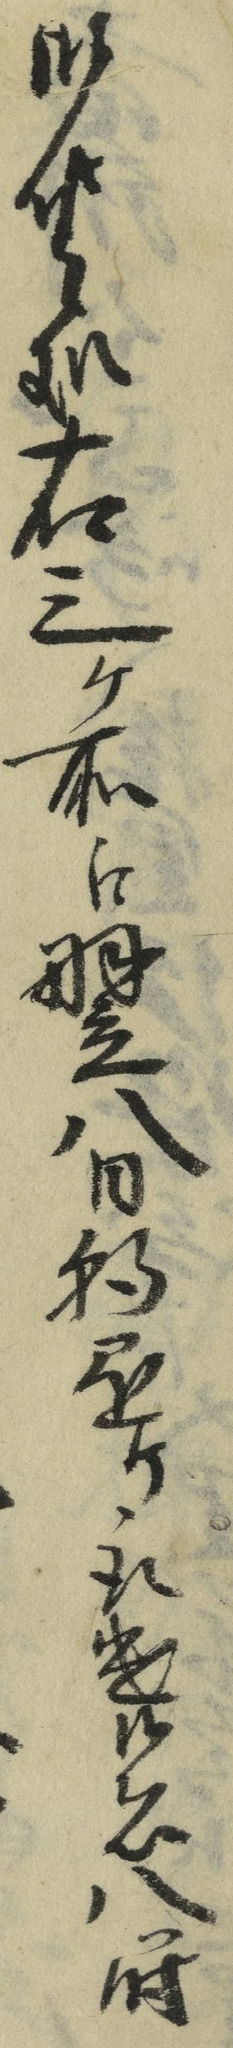御座候処右三ケ所江翌八日朝懸けケ取遣候者八ツ時
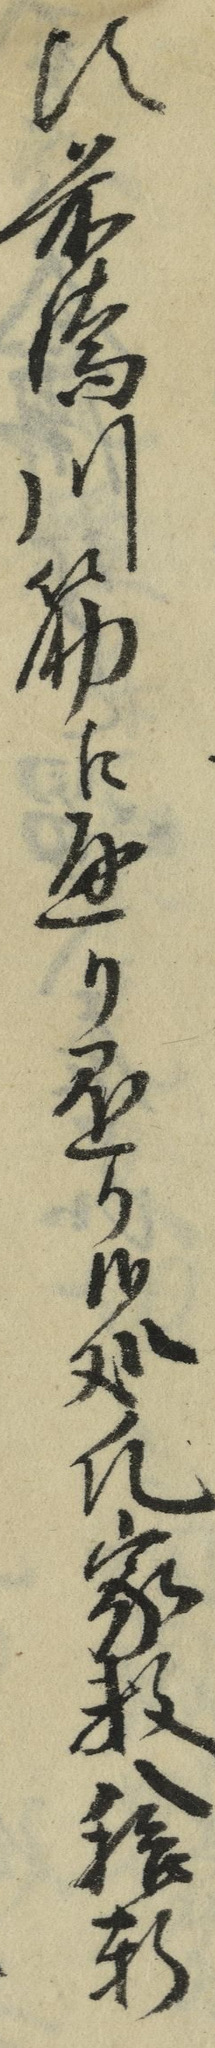頃前橋川筋江通り懸り候処凡家数八拾軒
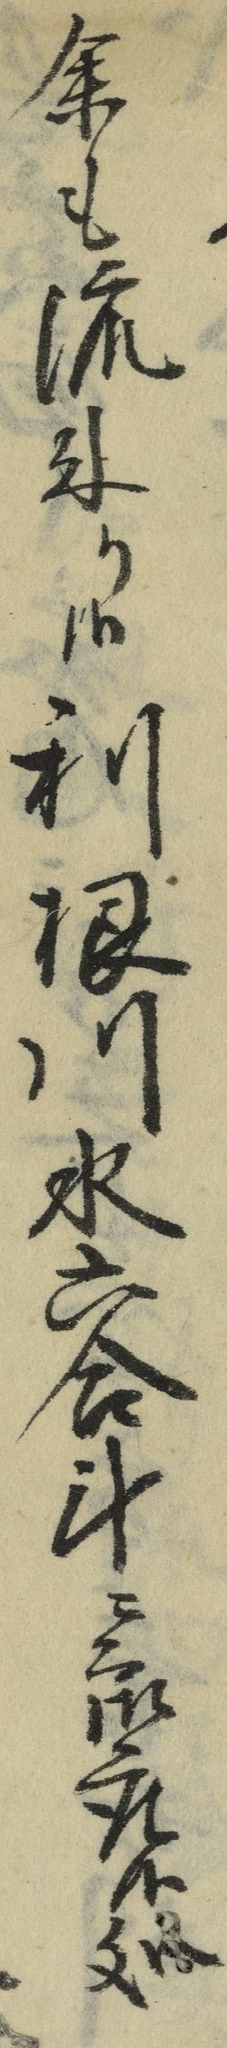余も流来り候利根川水六合計に而御座候処
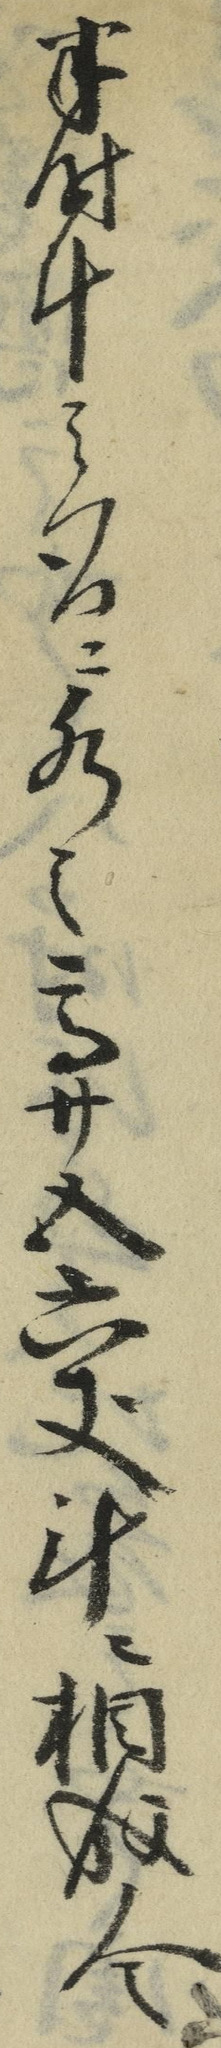半時計之間に水之高サ五六丈計に相成人之
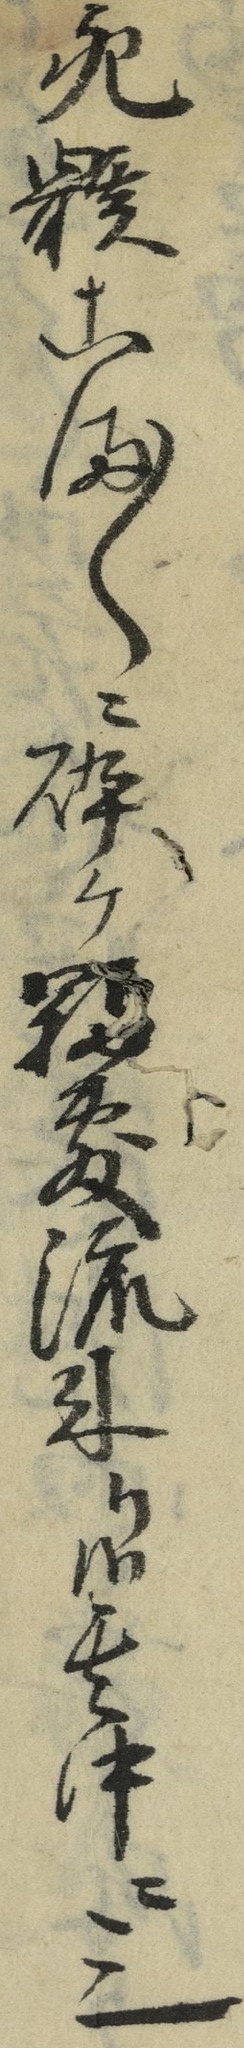死骸こま〳〵に砕ケ夥敷流来り候其中に三
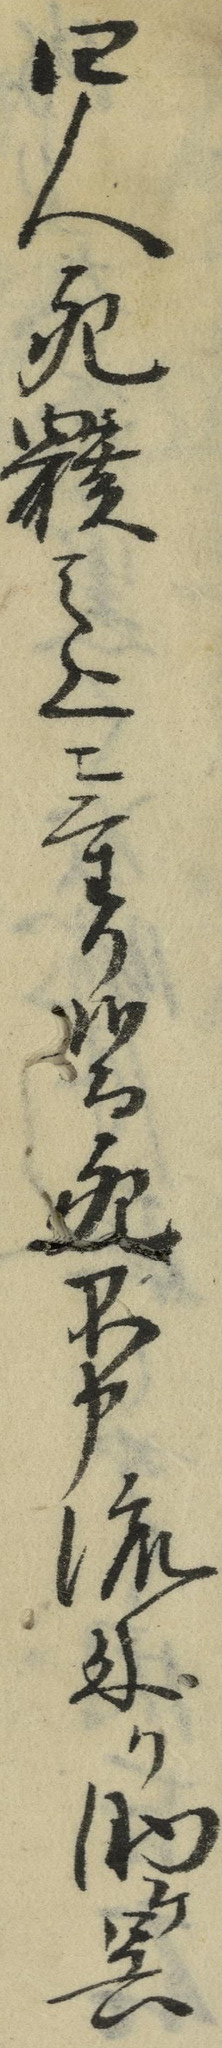四人死骸之上に重り候而死不申流来り助ケ呉
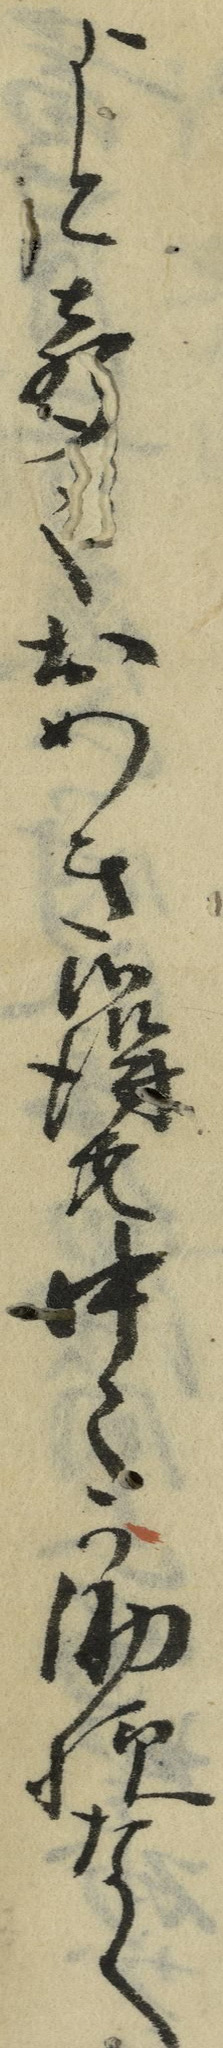よと声之おめき候得共中々可助様なく
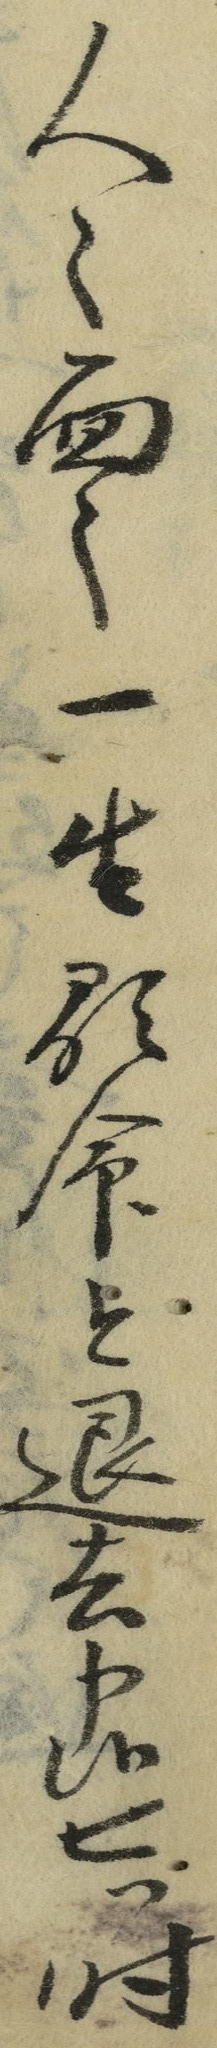人々面々一生顕命と退去申候七ツ時
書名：天明三卯年七月　浅間山焼注進写
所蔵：東京大学地震研究所図書室 Earthquake Research Institute Library, The University of Tokyo, JAPAN
